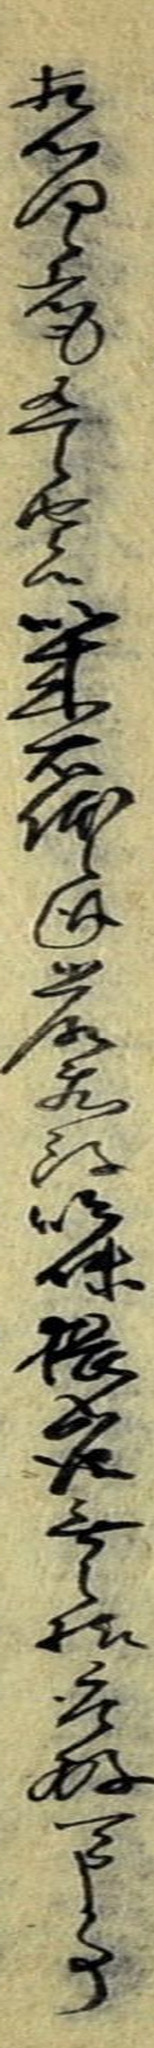相心得候者も有之由ニ候以来右体之趣厳敷致吟味猥成儀無之様取扱可申事
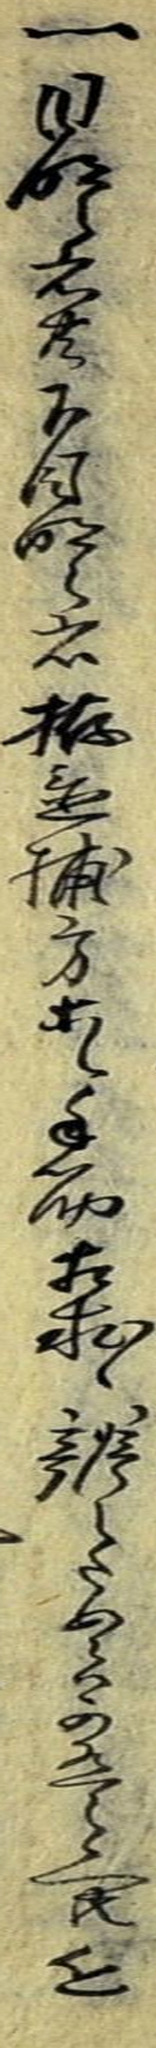一目明之者共下目明之者拵置捕方等へ手筋相求候弁之ためニハ可有之候へ共近
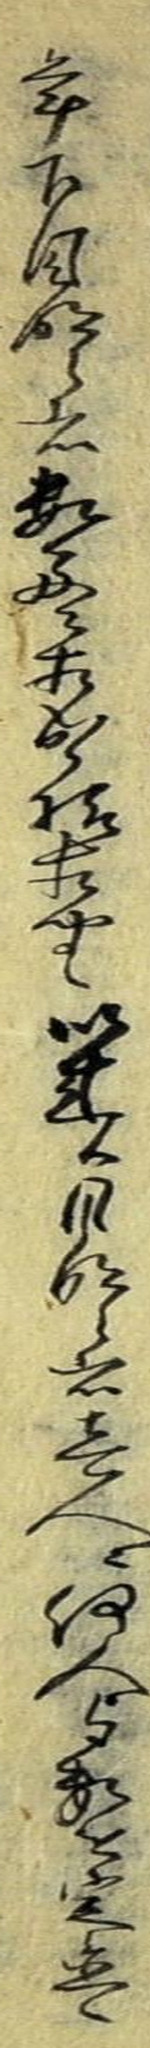年下目明之者数多ニ相成候様相聞候以来ハ目明之者壱人ニ何人与数を定置候
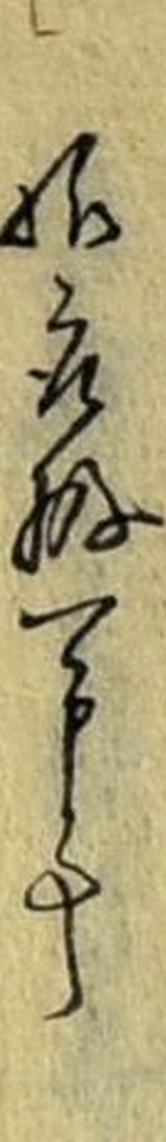様取扱可申事
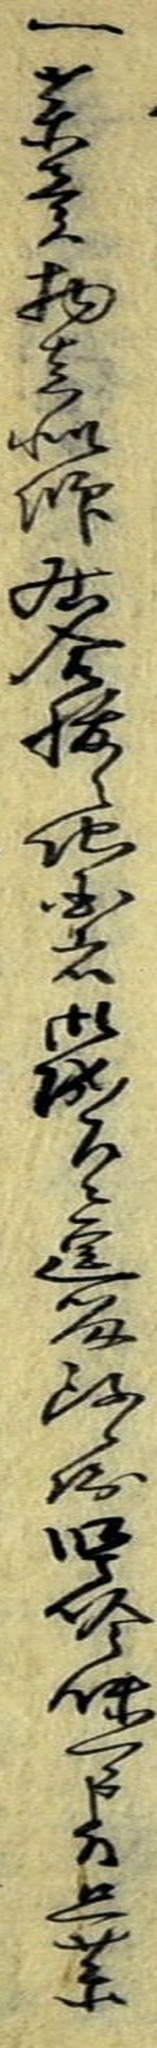一薬売物真似師居合抜之他国者御城下ニ逗留致候儀堅吟味可申付且菜
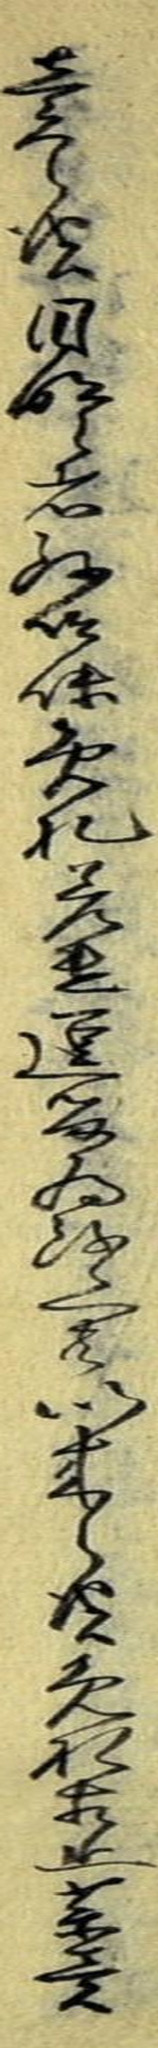売之儀ハ目明之者致吟味免札差遣逗留為致候へ共以来之儀ハ免札相止菜売

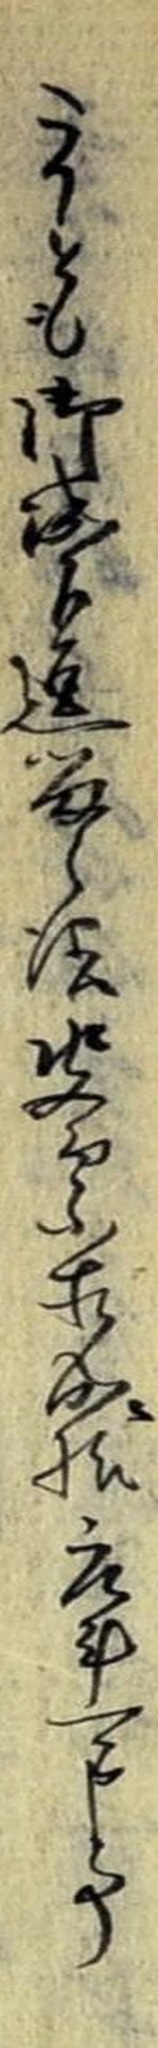たりとも御城下逗留之儀ハ決而不相成候様取計可申事
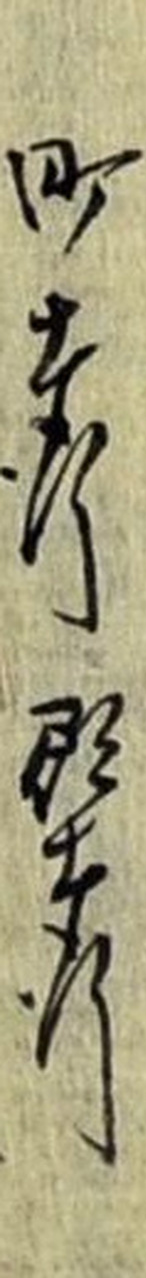町奉行郡奉行
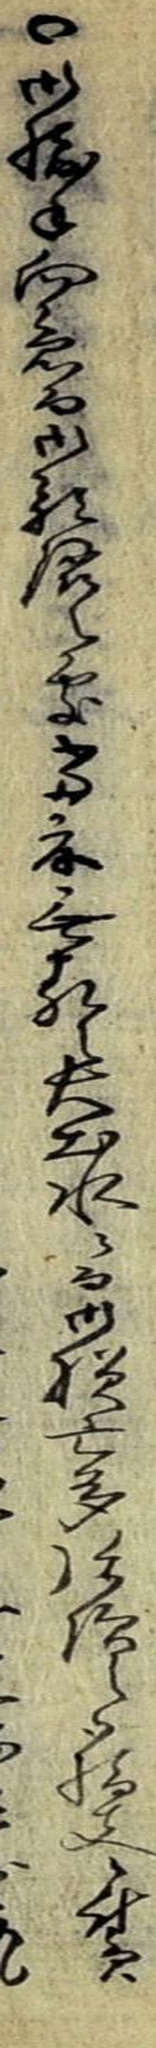〇御勝手向兼而御難渋之処当夏無類之大出水ニ而御損亡多弥増之御指支ニ付而ハ
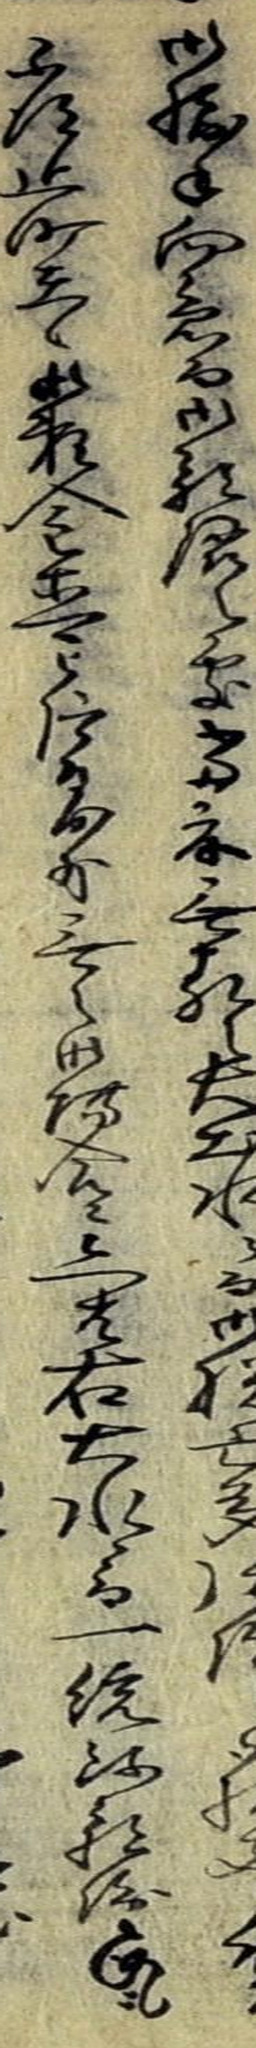不得止町在へ御頼金等可被仰付ゟ外無之御場合ニ候へ共右大水ニ而一統致難儀之趣も
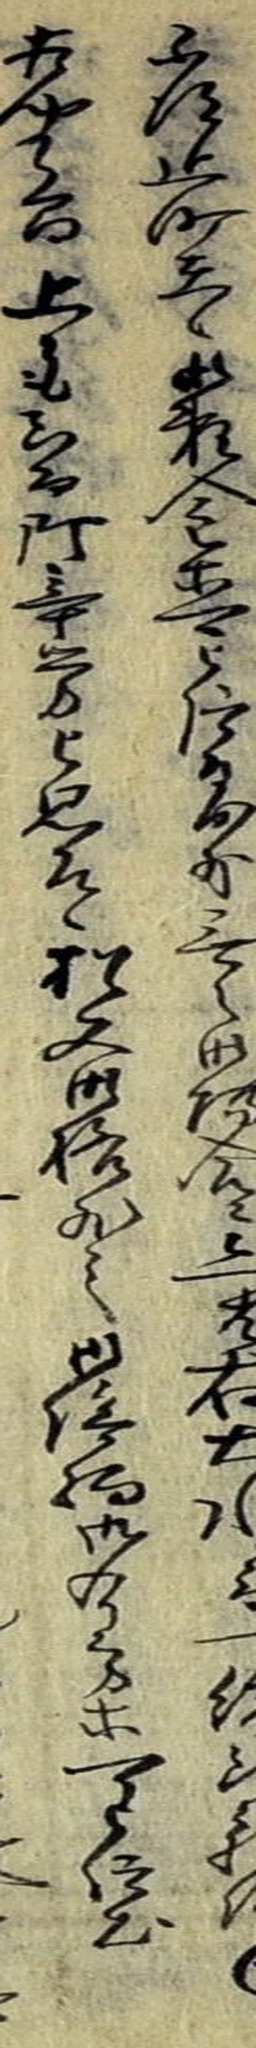相聞候間上ニも至而御辛労被思召候猶又御格外之御倹約御〆り方等可被仰出
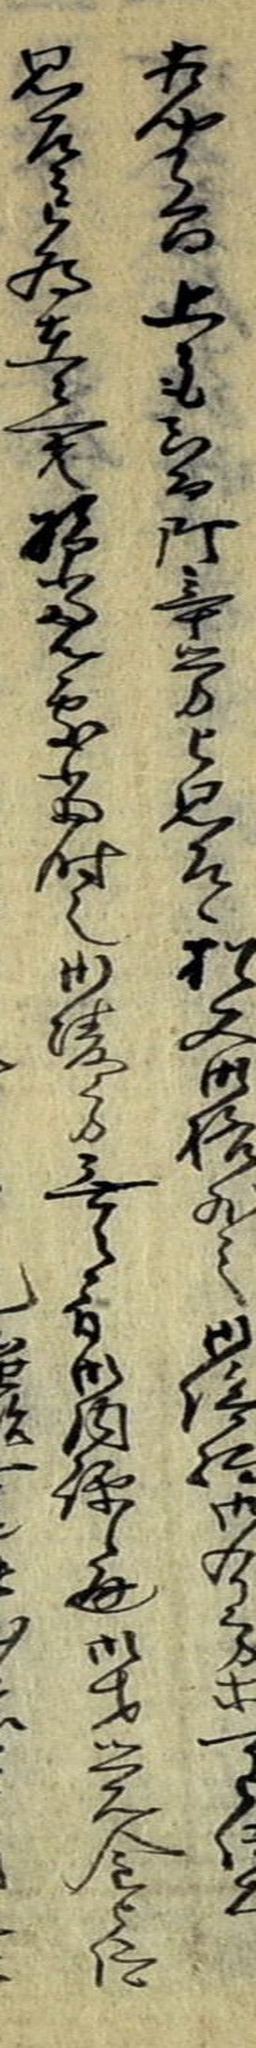思召ニ被為在候へ共指当ル処当時之御凌方無之ニ付御内評之通御才覚金被仰
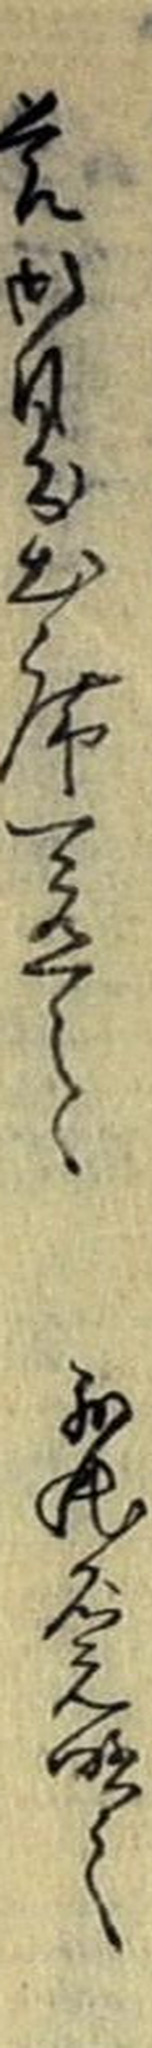節御自分出席可有之候別紙名元略之
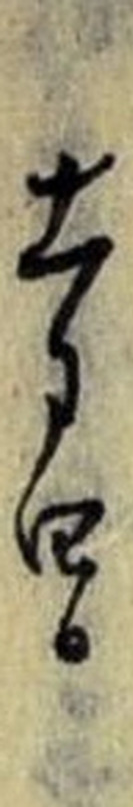十一月四日
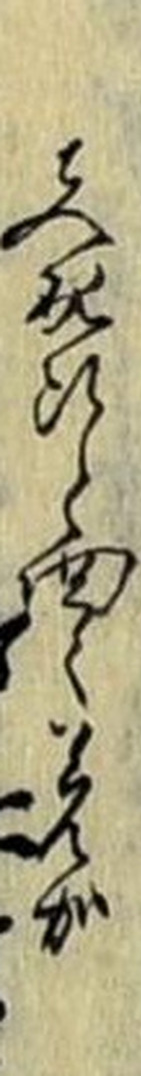支配頭之面々差加
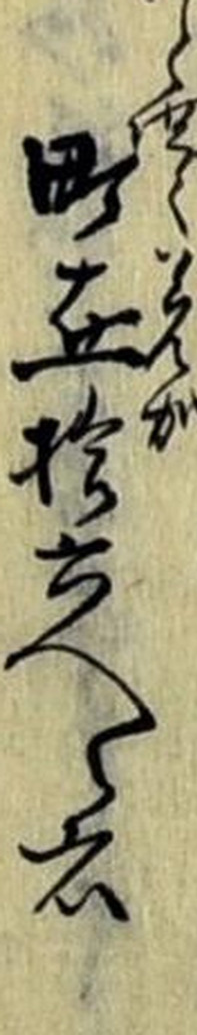町在拾六人之者
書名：命令之部 三
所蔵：福井県文書館 Fukui Prefectural Archives
